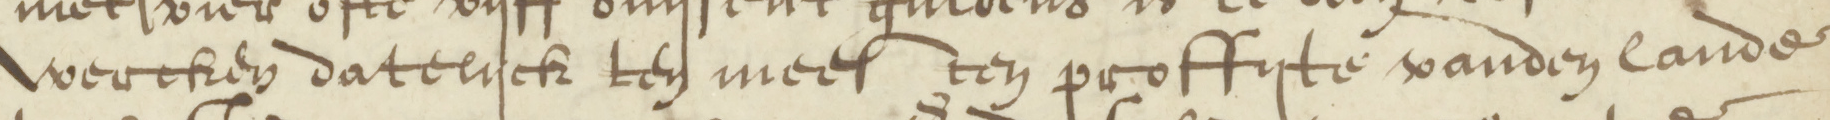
wercken datelyck ten meesten proffyte vanden lande
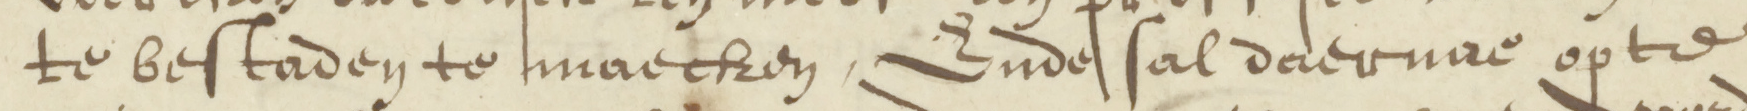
te bestaden te maecken. Ende sal daernae opte
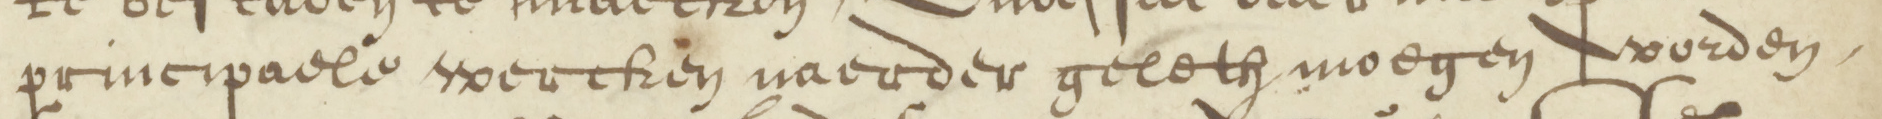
principaele wercken naerder geleth moegen worden,
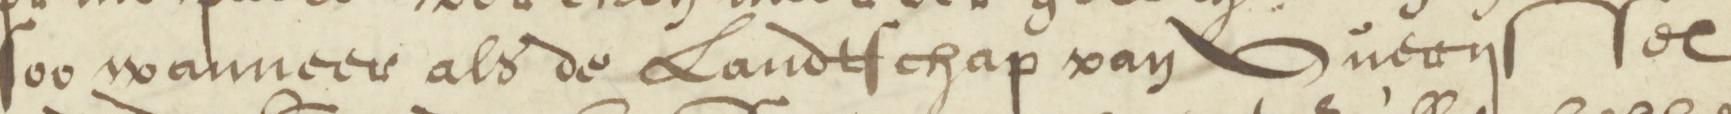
soo wanneer als de Landtschap van Overyssel
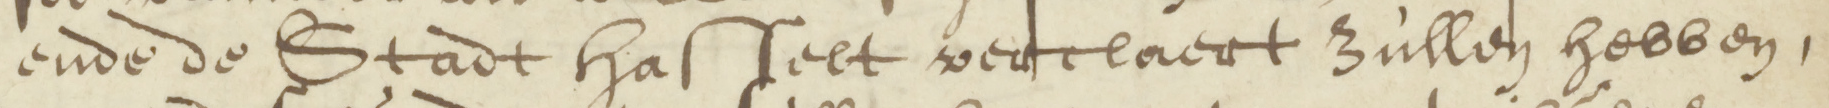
ende de Stadt Hasselt verclaert zullen hebben,
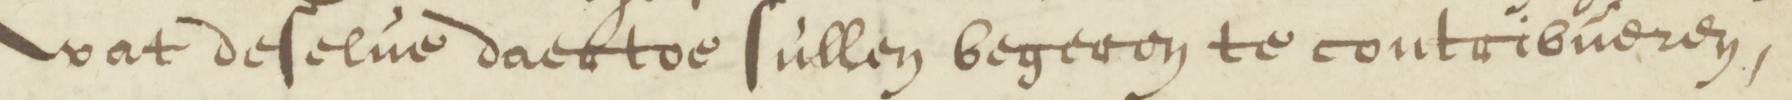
wat deselue daertoe sullen begeren te contribueren.
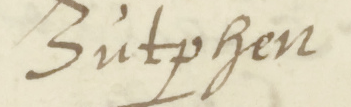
Zutphen
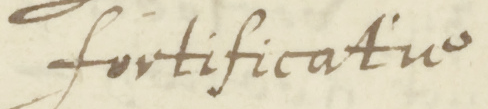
fortificatie
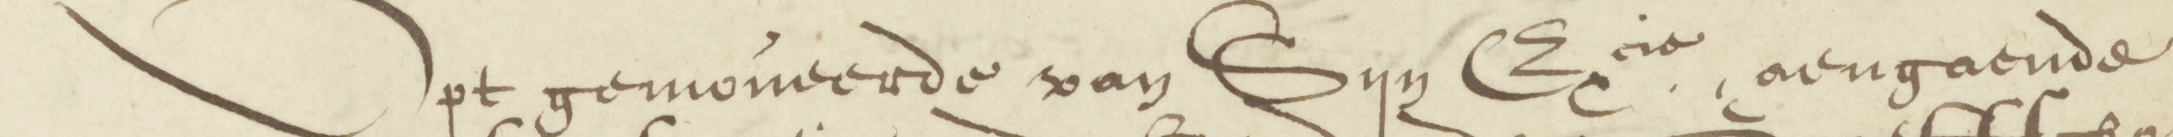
Opt gemoueerde van Syn Excie. aengaende
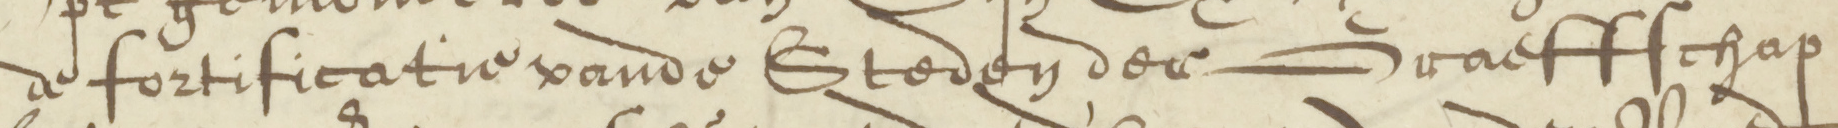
de fortificatie vande Steden der Graeffschap
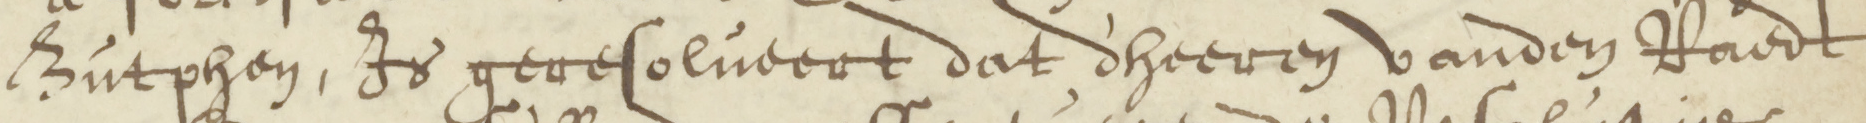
Zutphen, Is geresolueert dat d'heeren vanden Raedt
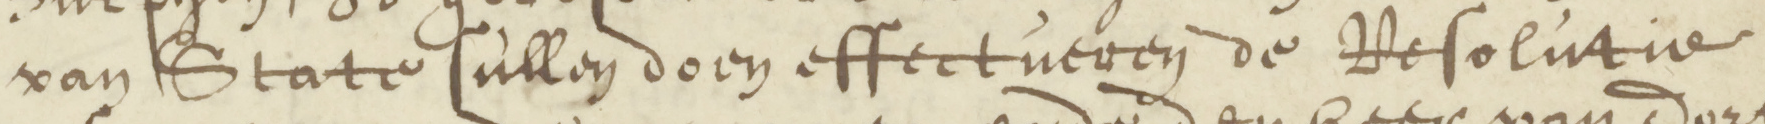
van State sullen doen effectueren de Resolutie
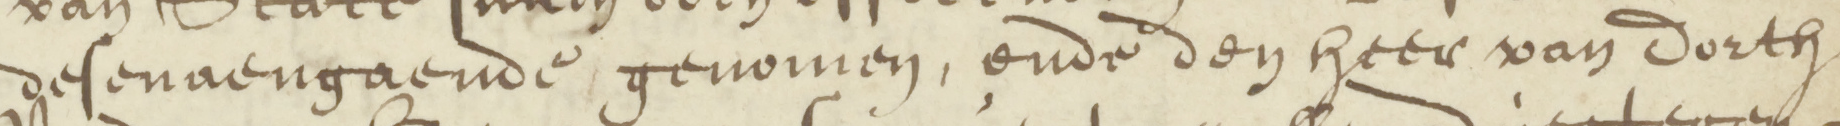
desenaengaende genomen, ende den heer van Dorth
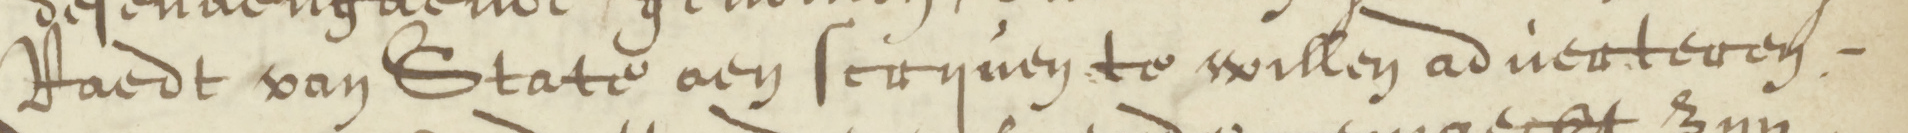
Raedt van State aen scryuen te willen adverteren -
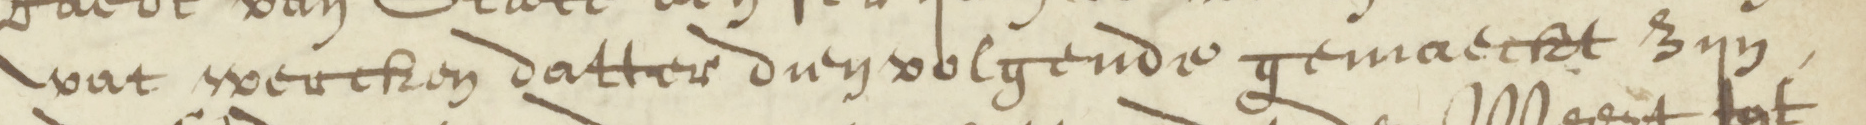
wat wercken datter dienvolgende gemaeckt zyn,
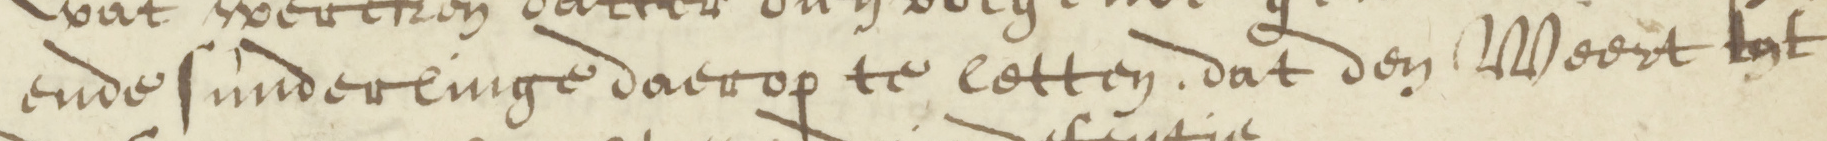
ende sunderlinge daerop te letten, dat den Weert tot
